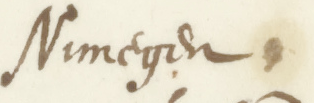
Nimegen
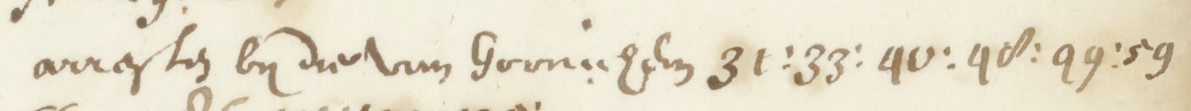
arresten bij die van Gorinchem 31: 33: 40: 48: 49: 59
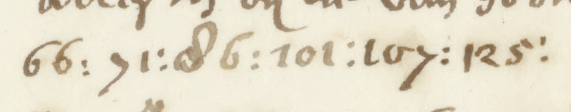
66: 71: 86: 101: 107: 125:
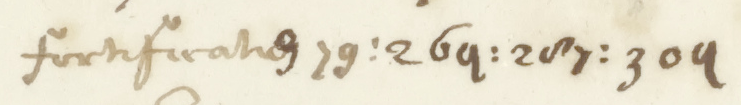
fortifictien 79: 264: 287: 304
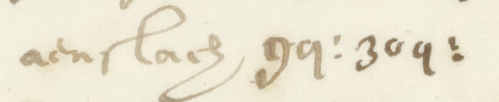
aenslach 94: 304:
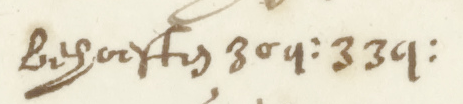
behoeften 304: 334:
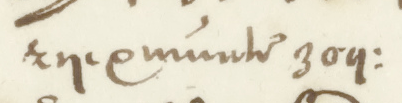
rijcxmunte 304:
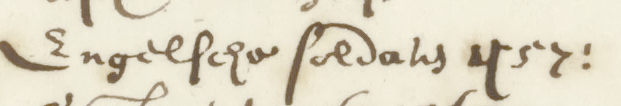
Engelsche soldaten 457:
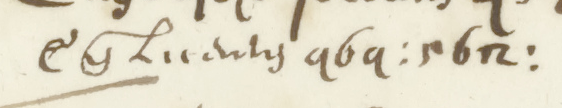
C & Licenten 464: 562:
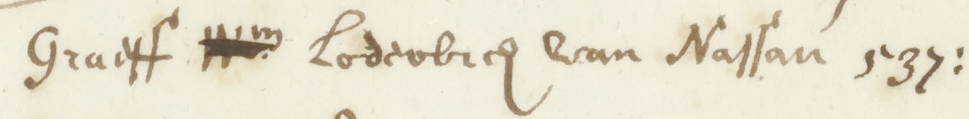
Graeff Wm. Lodewich van Nassau 537:
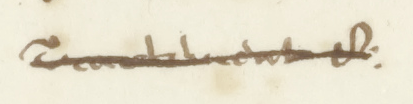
Tractement 8:
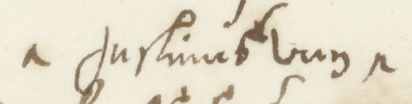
^ justinus van ^
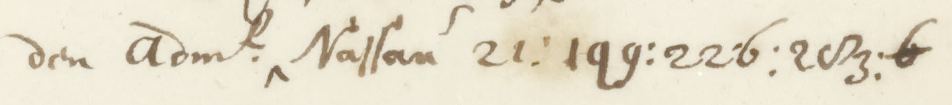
den Adml. ^ Nassau 21: 149: 226: 283: 6
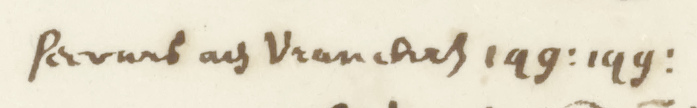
secours aen Vranckrk 149: 149:
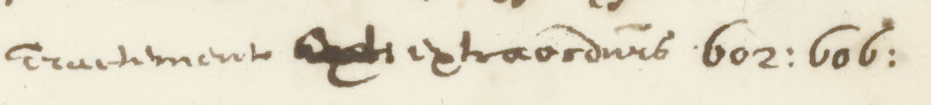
Tractement Exts extraordnrs 602: 606:
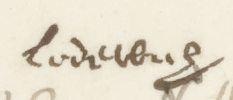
lodewich
